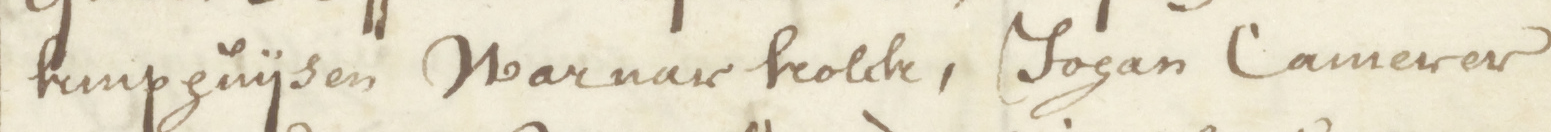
kniphuijsen Warnar kolck, Johan Camerer
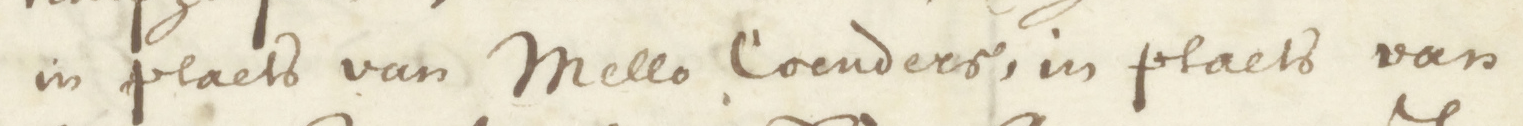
in plaets van Mello Coenders, in plaets van
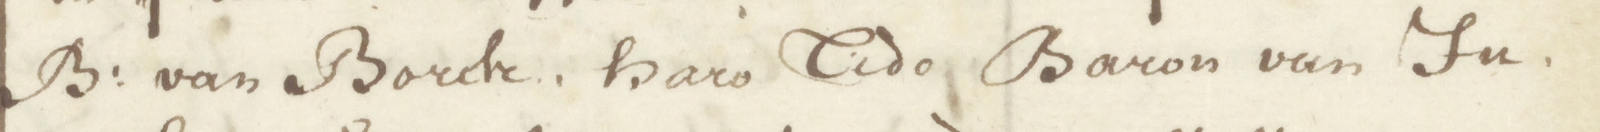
B: van Borck, Haro Tido Baron van In
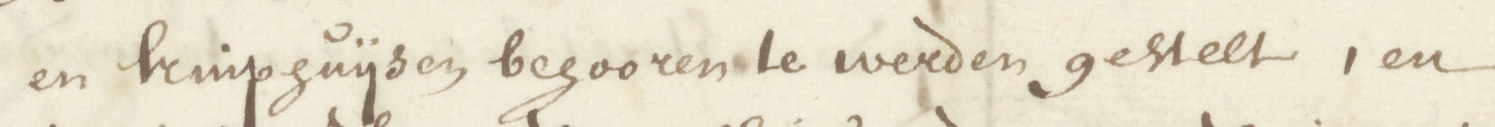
en Kniphuijsen behooren te werden gestelt, en
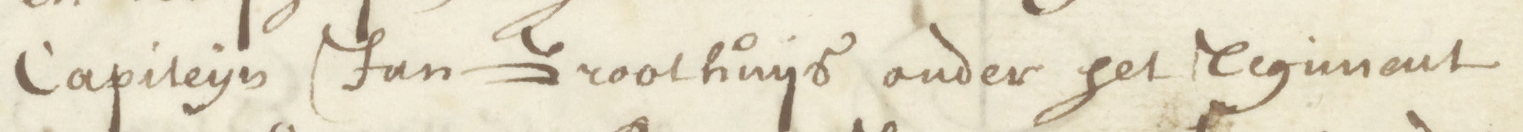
Capiteijn, Jan Groothuijs onder het Regiment
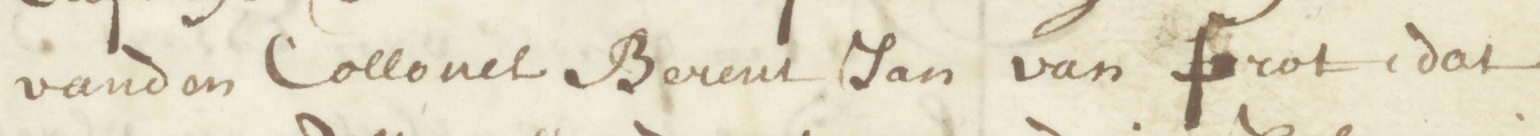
vanden Collonel Berent Jan van Prot, dat
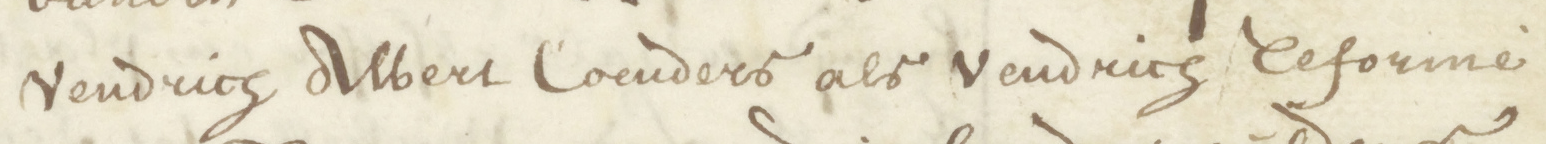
Vendrich Albert Coenders als Vendrich reforme
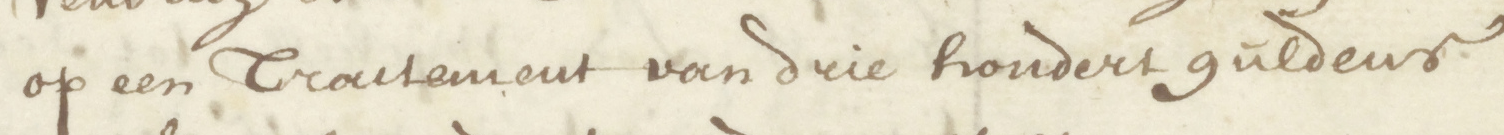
op een Tractement van drie hondert guldens
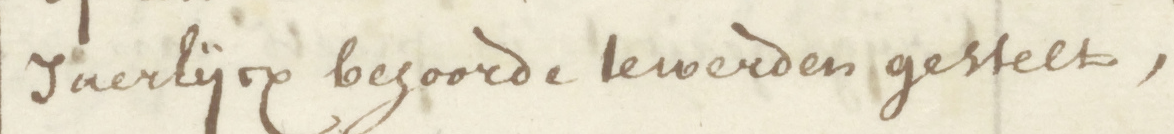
Jaerlijcx behoorde te werden gestelt,
